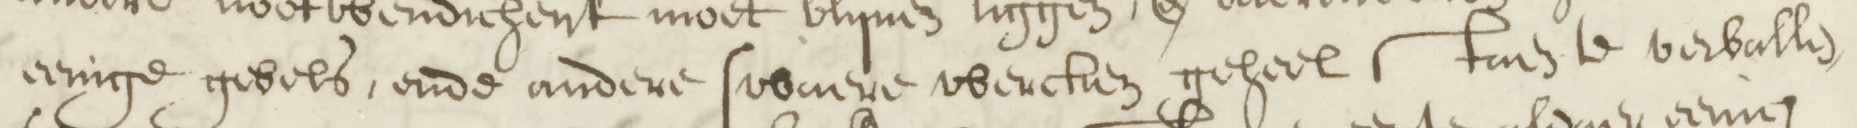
eenige gevels, ende andere swaere wercken geheel staen te vervallen,
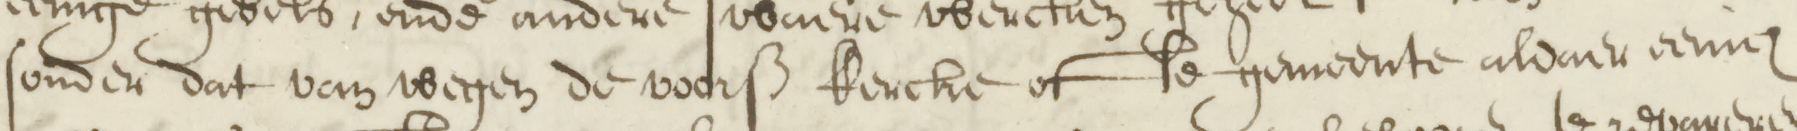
sonder dat van wegen de voors kercke ofte gemeente aldaer eenich
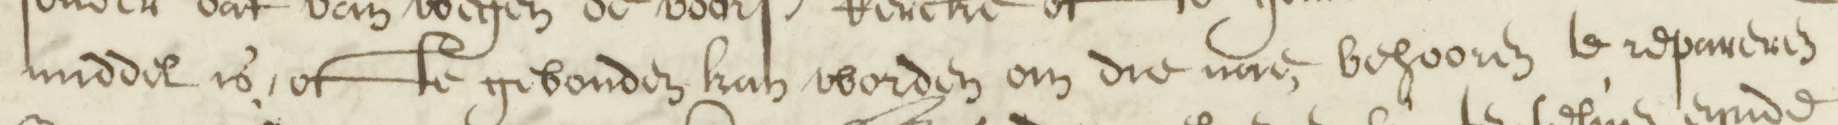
middel is, ofte gevonden kan worden om die nae behooren te repareren
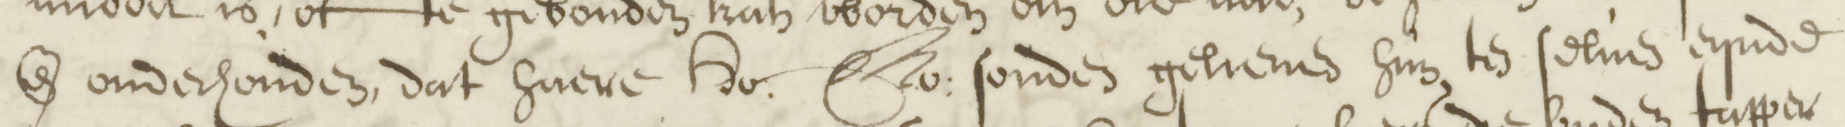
& onderhouden, dat haere Ho:Mo: souden gelieuen hun ten seluen eynde
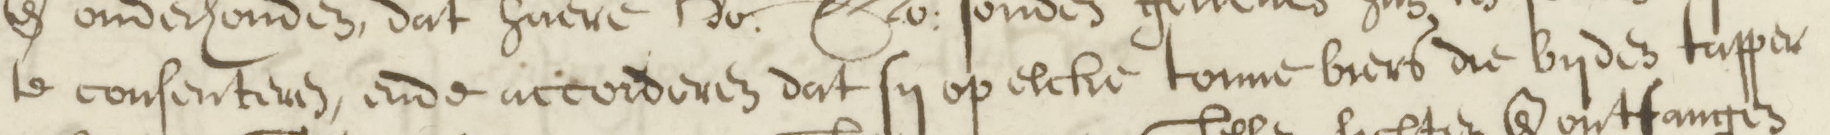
te consenteren, ende accorderen dat sy op elcke tonne biers die byden tapper
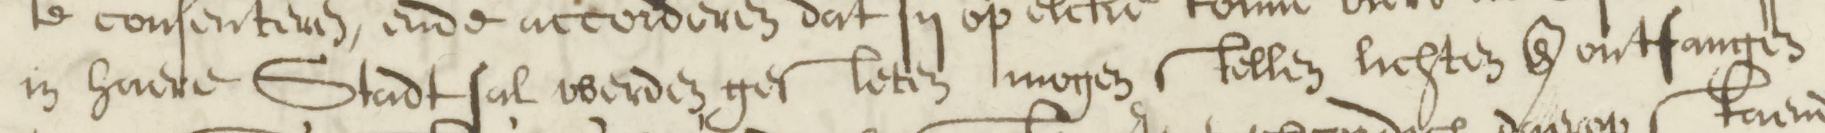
in haere Stadt sal werden gesleten mogen stellen lichten & ontfangen
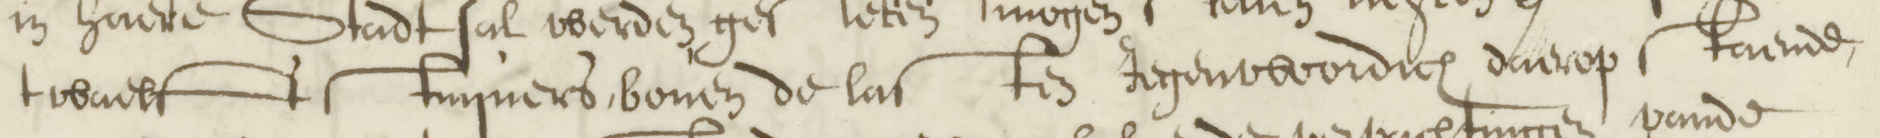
twaelff stuyuers, bouen de lasten Jegenwoordich daerop staende,
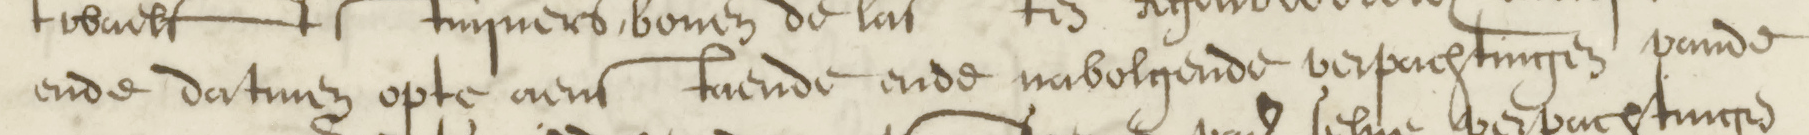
ende datmen opte aenstaende ende navolgende verpachtingen vande
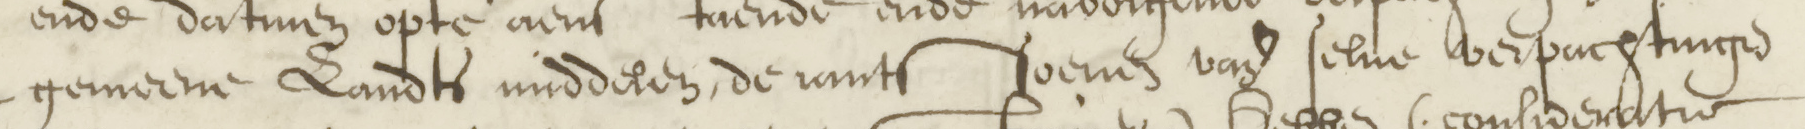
gemeene Landts middelen, de rantssoenen van selue verpachtinge
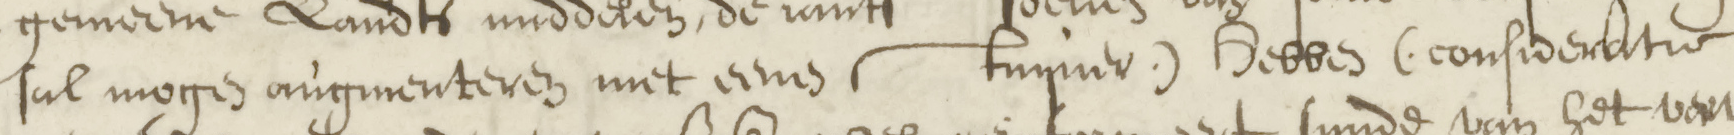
sal mogen augmenteren met eenen stuyuer.) hebben (.consideratie
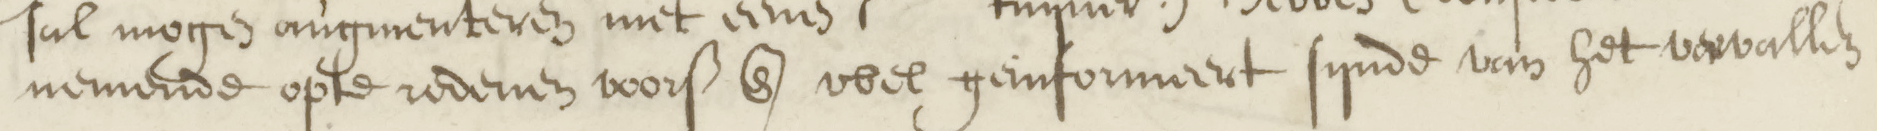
nemende opte redenen voors & wel geinformeert synde van het vervallen
